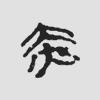赤
